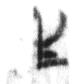生
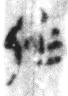於
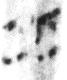多
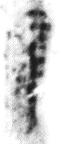福
